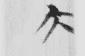大
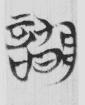詢
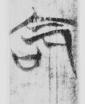命
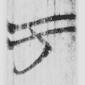于
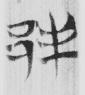邦
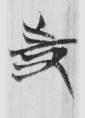寺
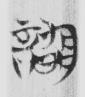詢
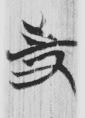寺
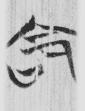命
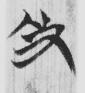及
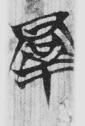羣
